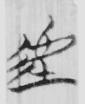𫊟
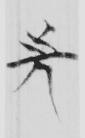先
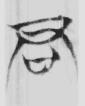君
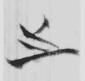之
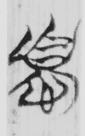𢝊
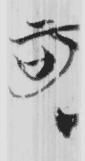可
